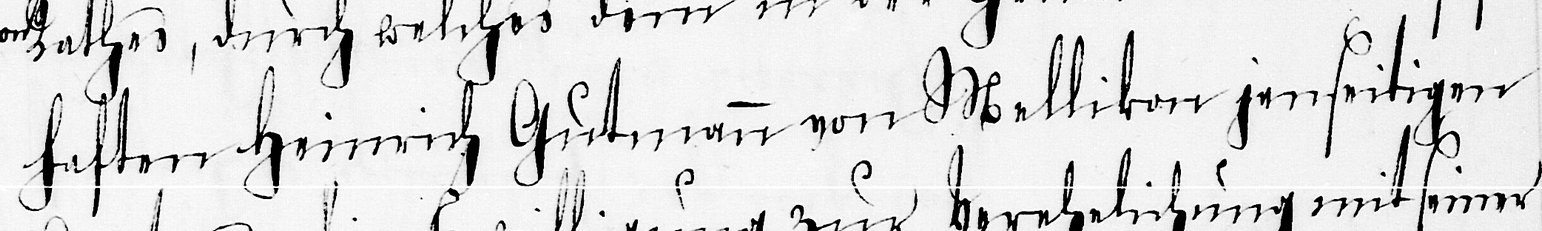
haften Heinrich Gutmann von Mellikon jenseitigen
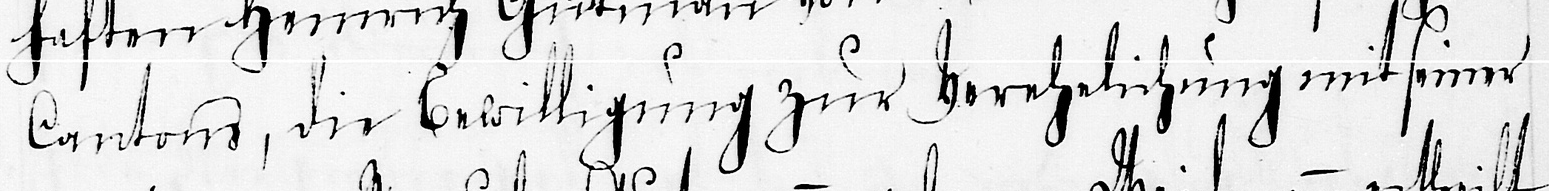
Cantons, die Bewilligung zur Verehelichung mit seiner
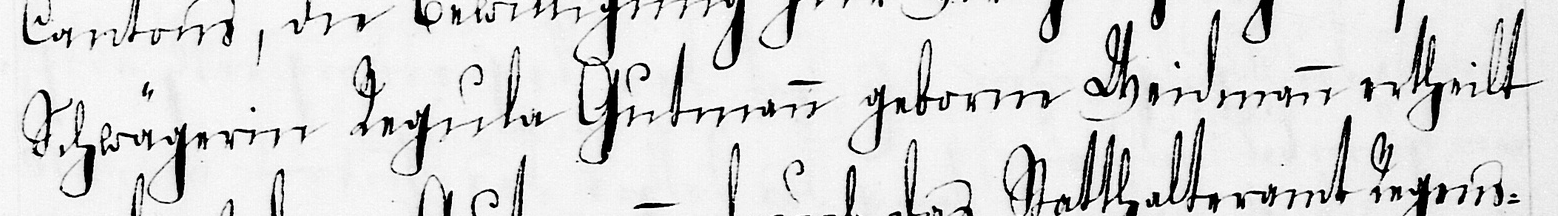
Schwägerin Regula Gutmann geborne Weidmann ertheilt
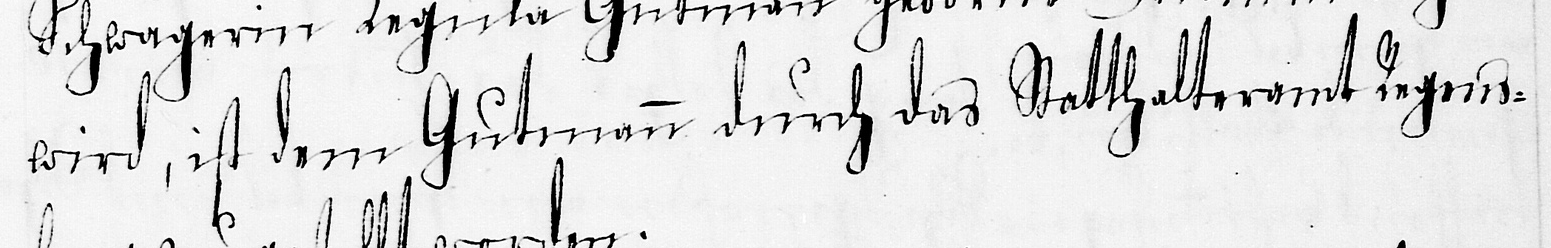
wird, ist dem Gutmann durch das Statthalteramt Regens¬
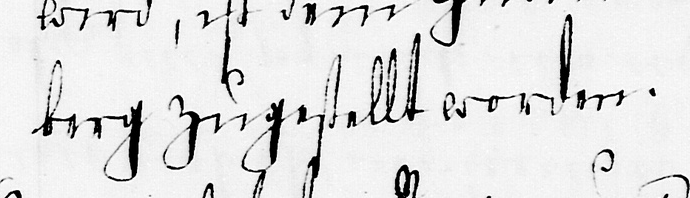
berg zugestellt worden.
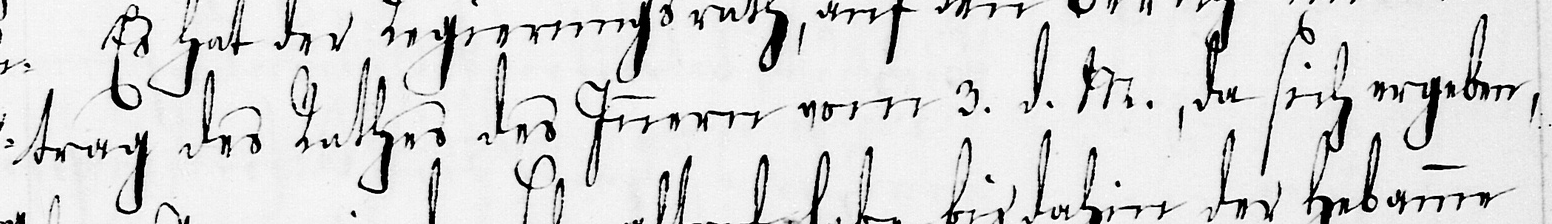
trag des Rathes des Innern vom 3. d. M., da sich ergeben,
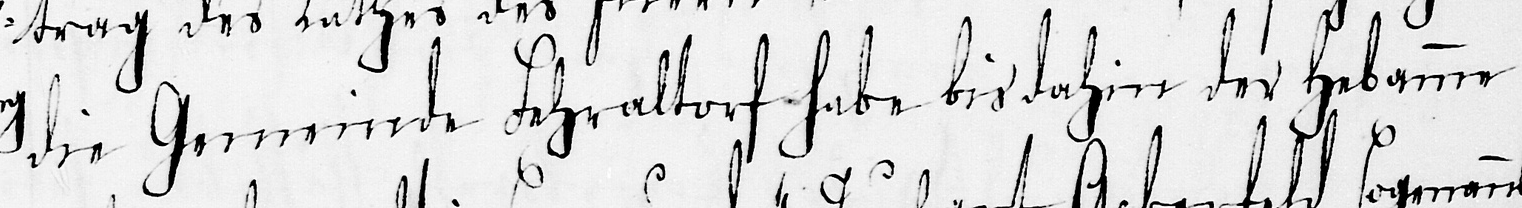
die Gemeinde Fehraltorf habe bis dahin der Hebamme
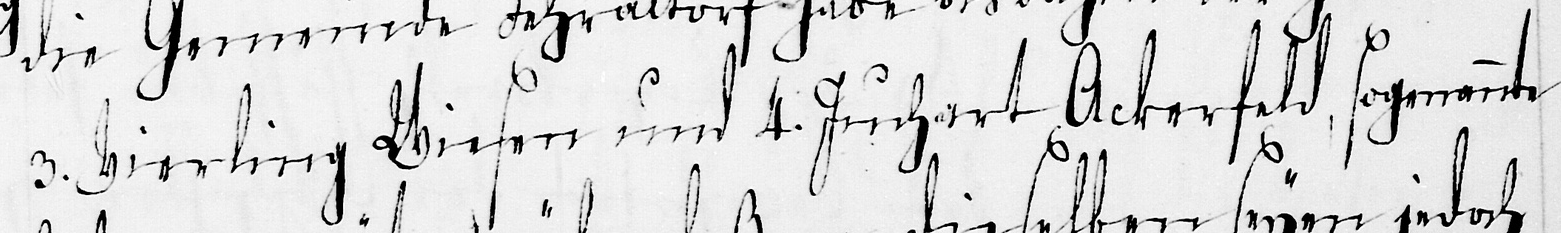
3. Vierling Wiesen und 4. Juchart Ackerfeld, sogenan¬
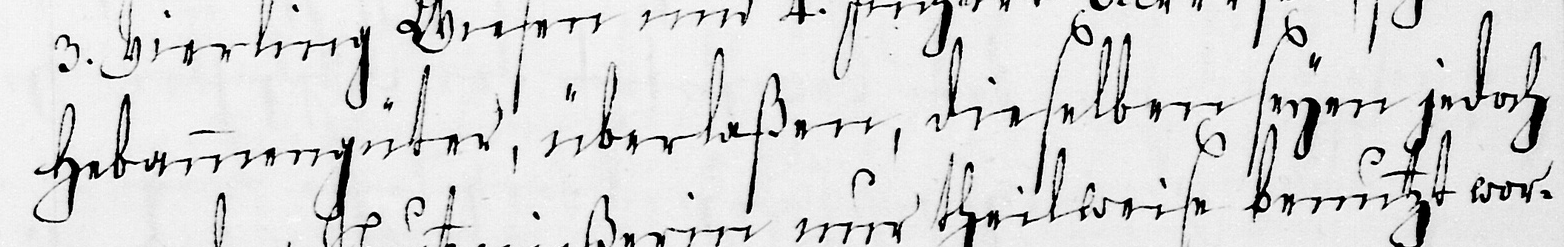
Hebammengüter, überlaßen, dieselben seyen jedoch
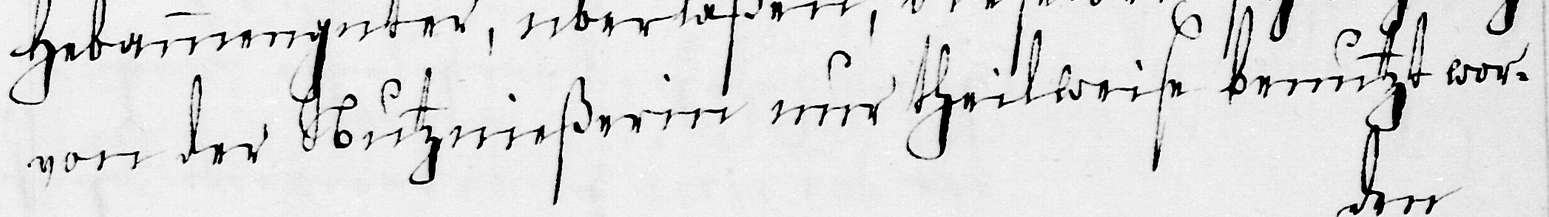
von der Nutznießerin nur theilweise benutzt wor-
